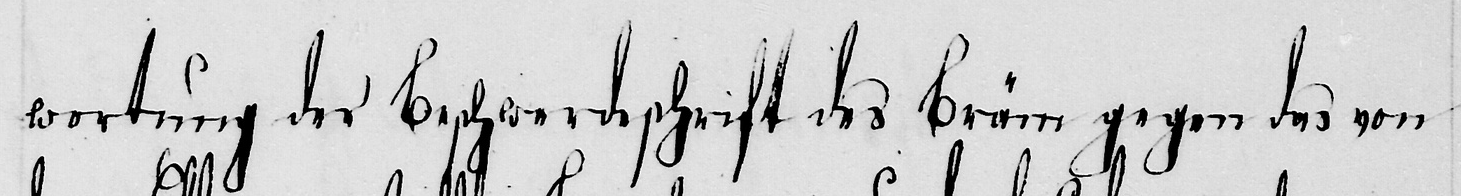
wortung der Beschwerdeschrift des Bräm gegen das von
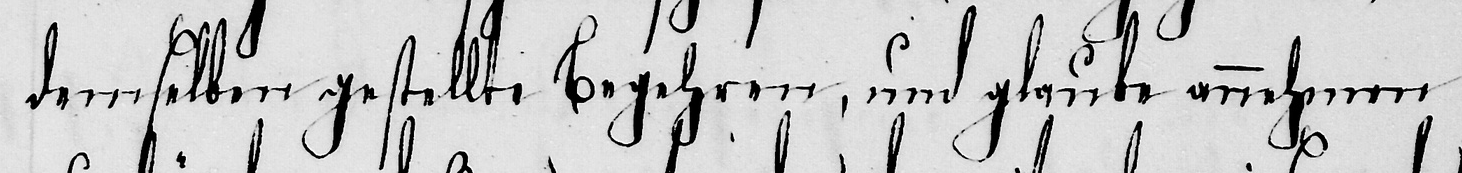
demselben gestellte Begehren, und glaube annehmen
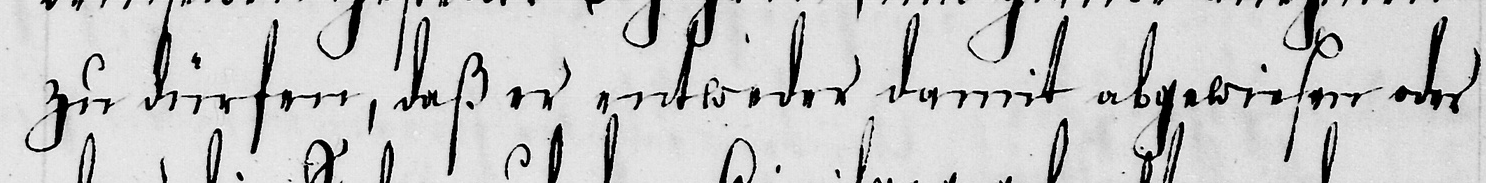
zu dürfen, daß er entweder damit abgewiesen oder
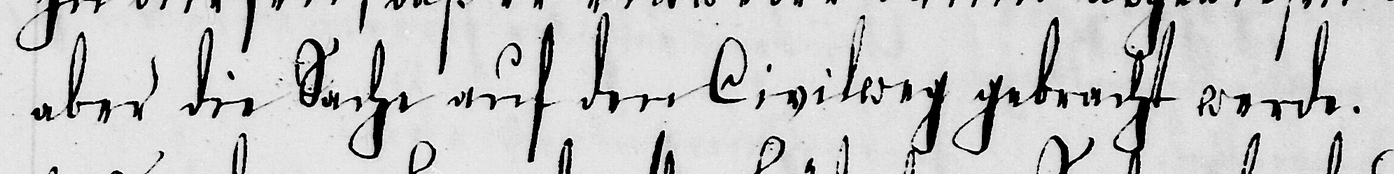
aber die Sache auf den Civilweg gebracht werde.
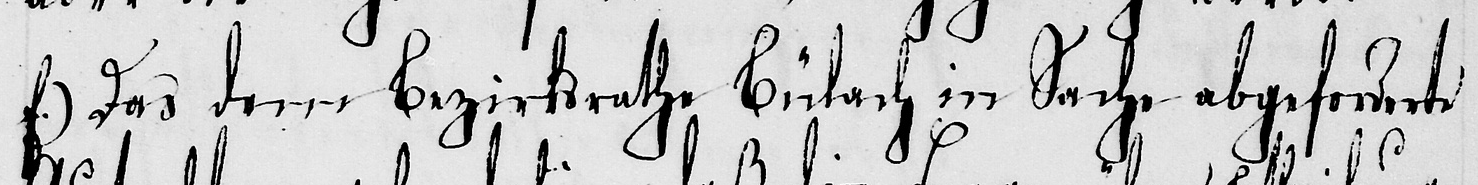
f.) Das dem Bezirksrathe Bülach in Sache abgesonder¬
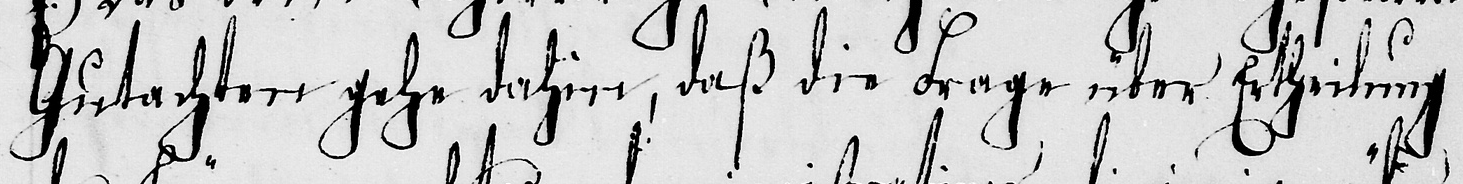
Gutachten gehe dahin, daß die Fage über Ertheilung
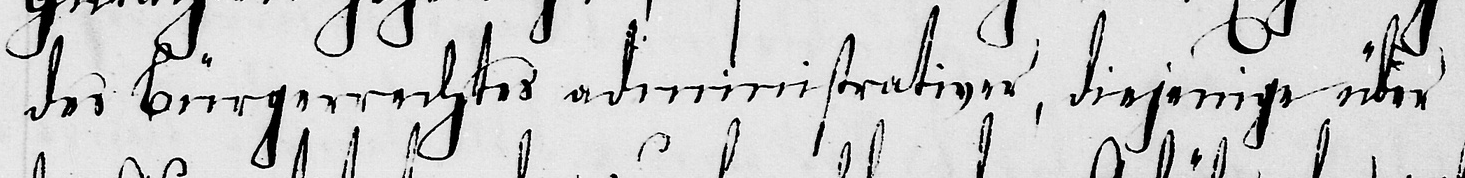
des Bürgerrechtes administrativer, diejenige über
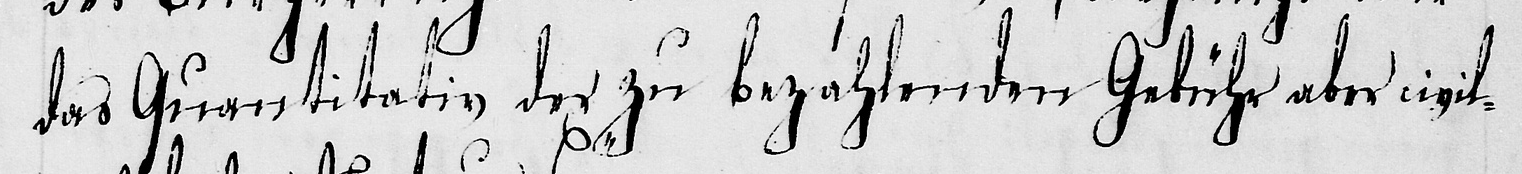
das Quantitativ der zu bezahlenden Gebühr aber civil¬
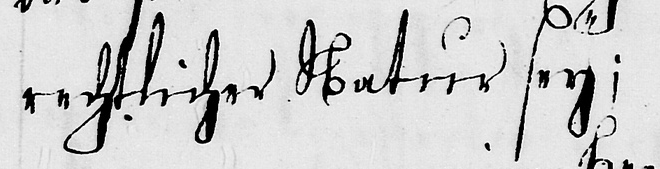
rechtlicher Natur sey;
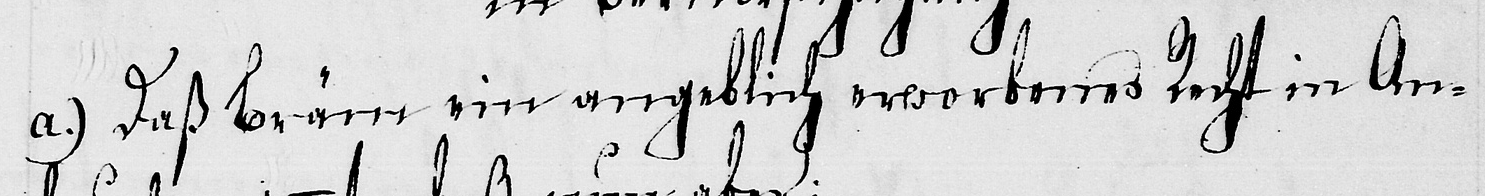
a.) Daß Bräm ein angeblich erworbenes Recht in An¬
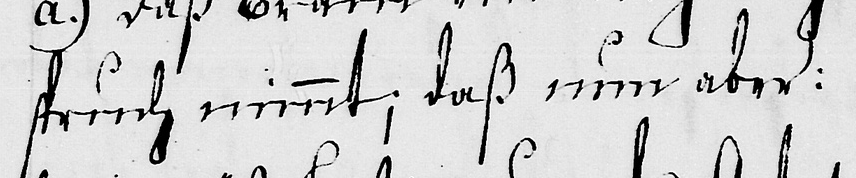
pruch nimmt; daß nun aber:
